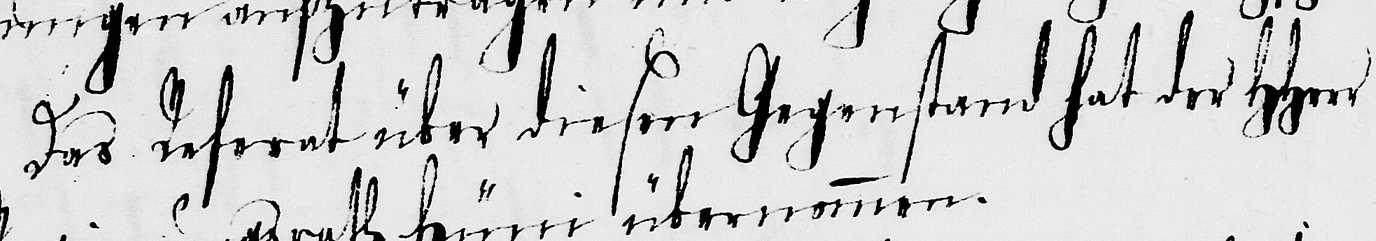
Das Referat über diesen Gegenstand hat der HHe¬
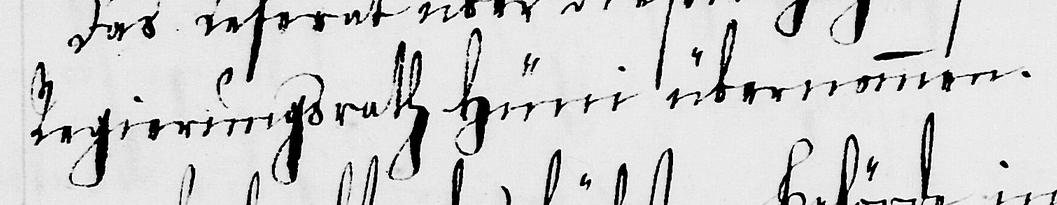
Regierungsrath Hüni übernommen.
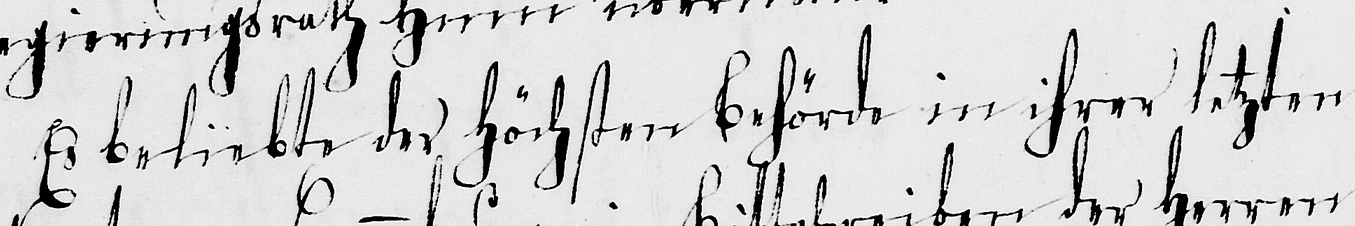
Es beliebte der Höchsten Behörde in ihrer letzten
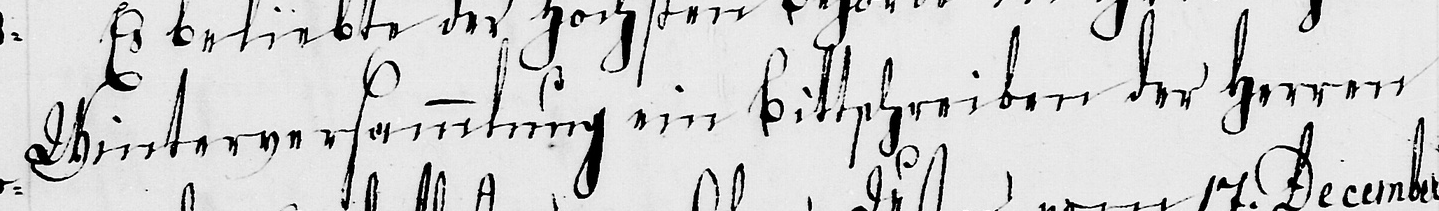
Winterversammlung ein Bittschreiben der Herren
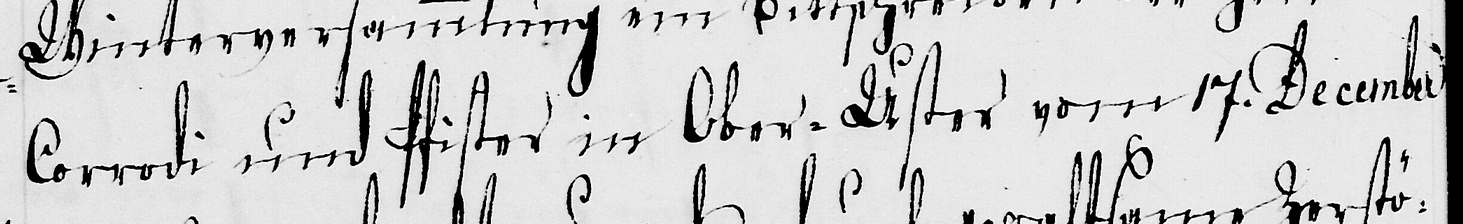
Corrodi und Pfister in Ober-Uster vom 17. December
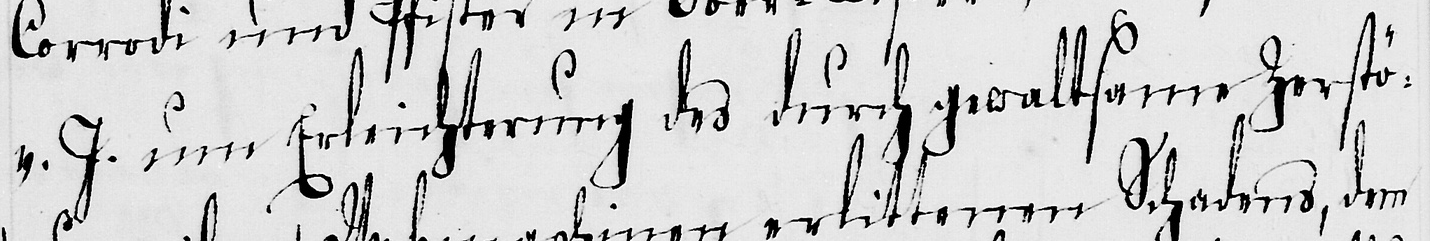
v. J. um Erleichterung des durch gewaltsame Zerstö¬
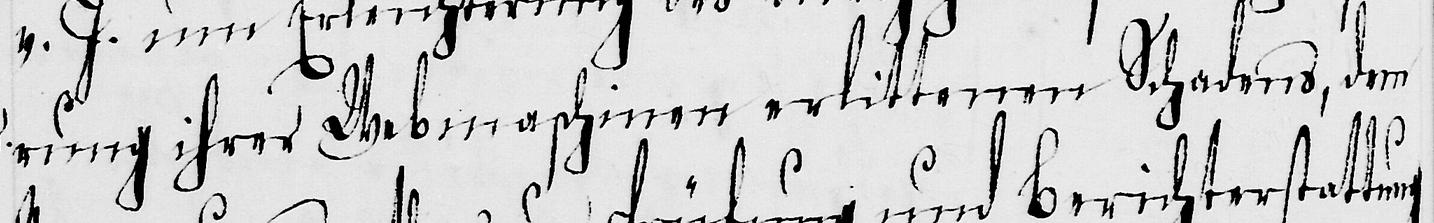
rung ihrer Webmaschinen erlittenen Schadens, dem
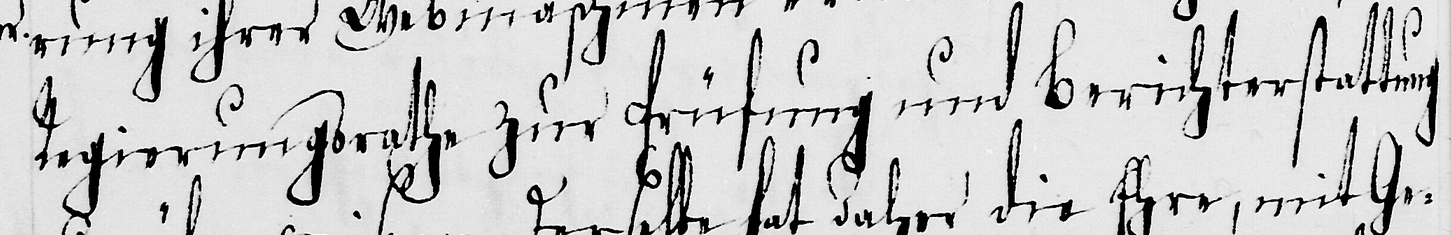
Regierungsrathe zur Prüfung und Berichterstatt¬
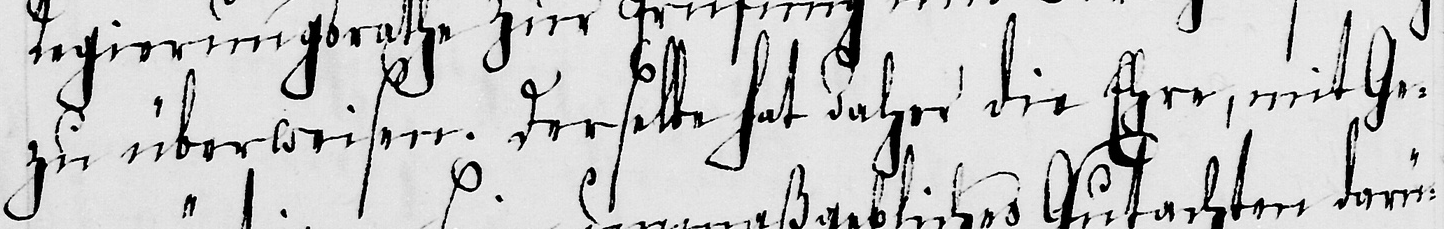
zu überweisen. Derselbe hat daher die Ehre, mit Ge¬
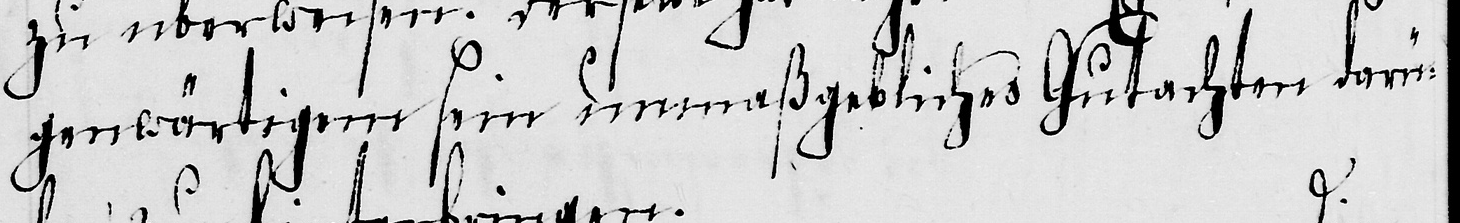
genwärtigem sein unmaßgebliches Gutachten darü¬
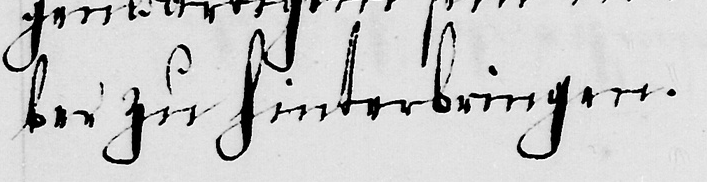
ber zu hinterbringen.
